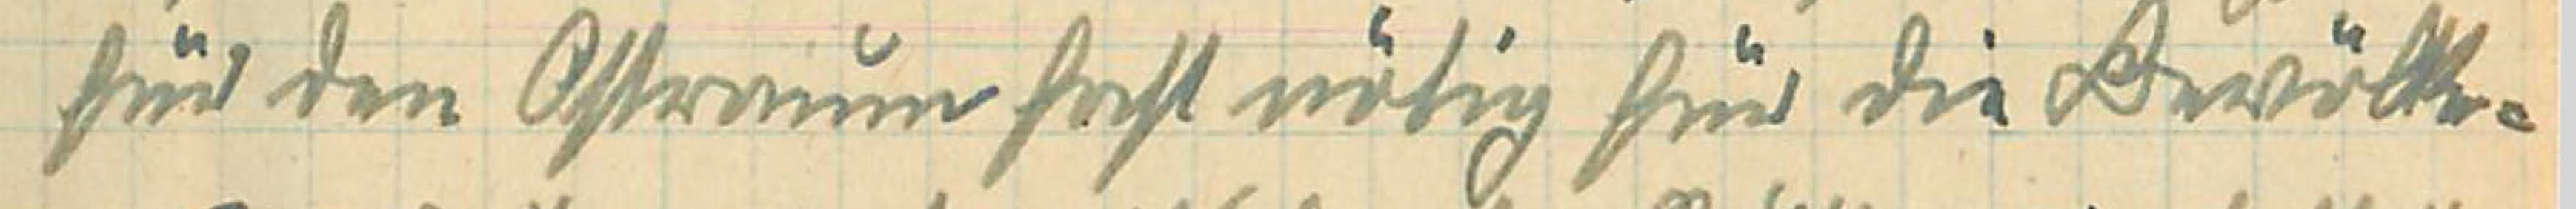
für den Ostraum fast nötig für die Bevölke-
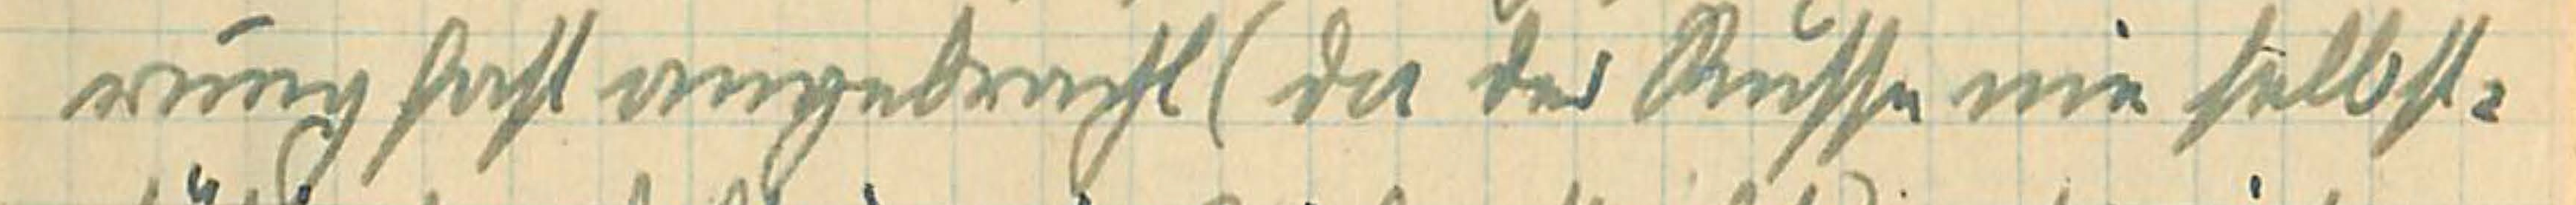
rung fast angebracht (da der Russe nie selbst-
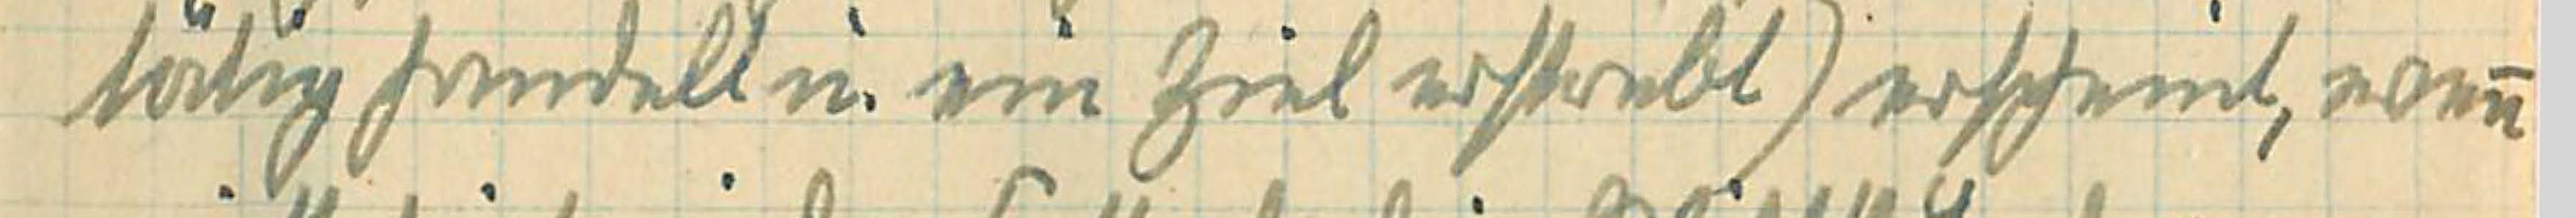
tätig handelt u. ein Ziel erstrebt) erscheint, wenn
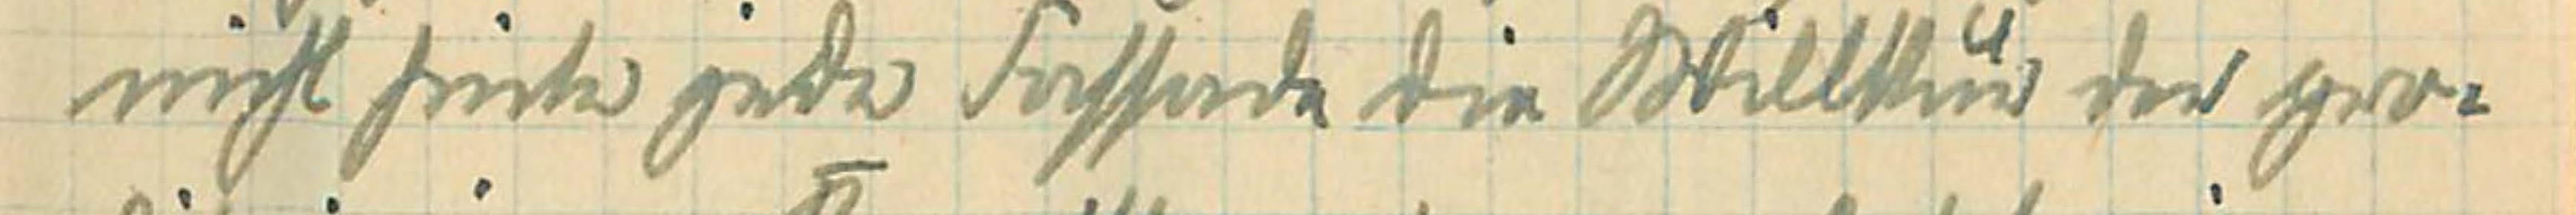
nicht hinter jeder Fassade die Willkür der pro-
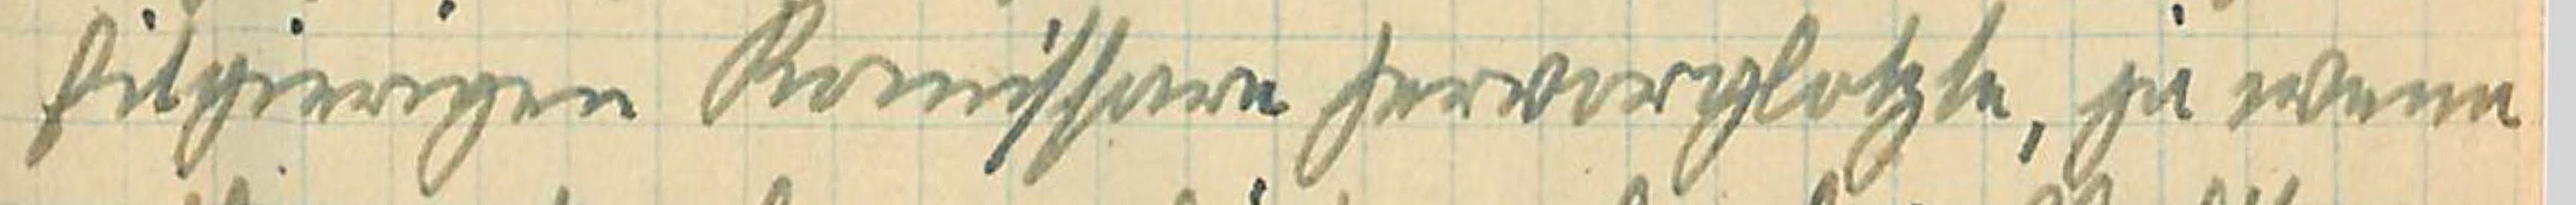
fitgierigen Komissare hervorglotzte, ja wenn
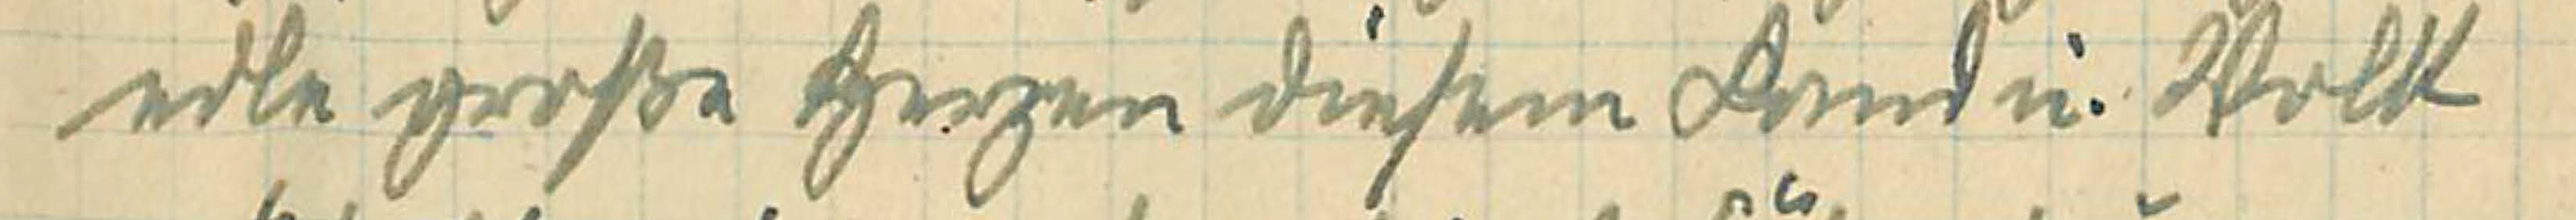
edle große Herzen diesem Land u. Volk
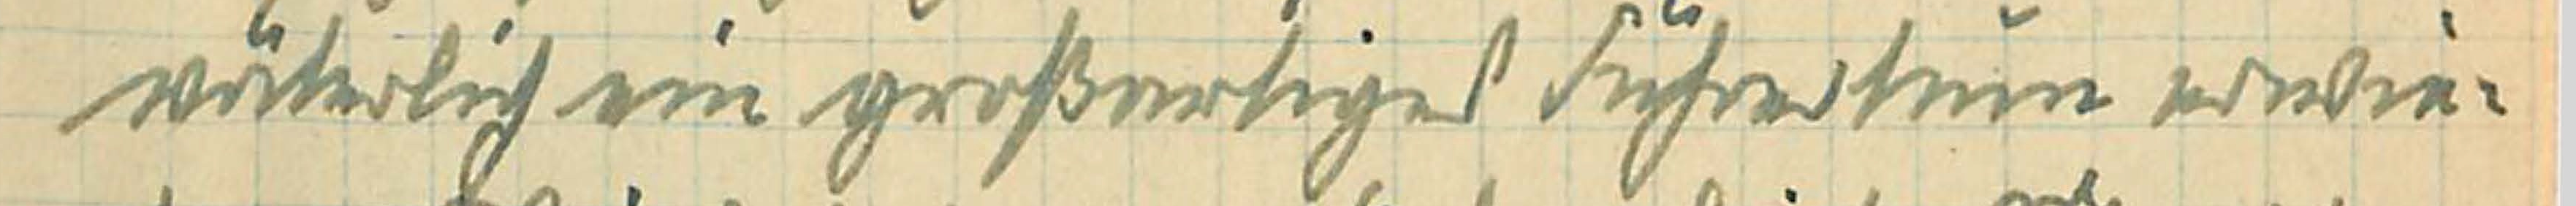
väterlich ein großartiges Führertum erwie-
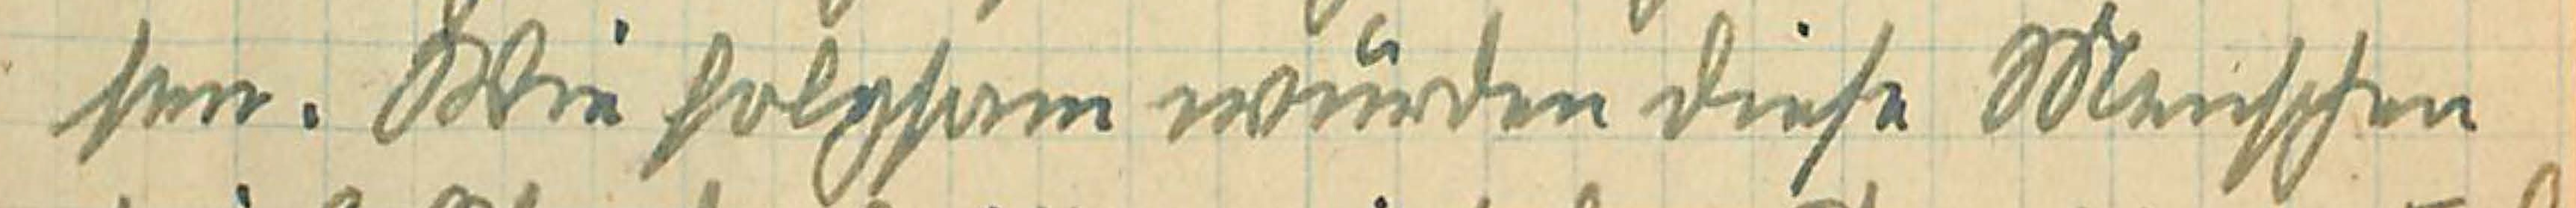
sen. Wie folgsam würden diese Menschen
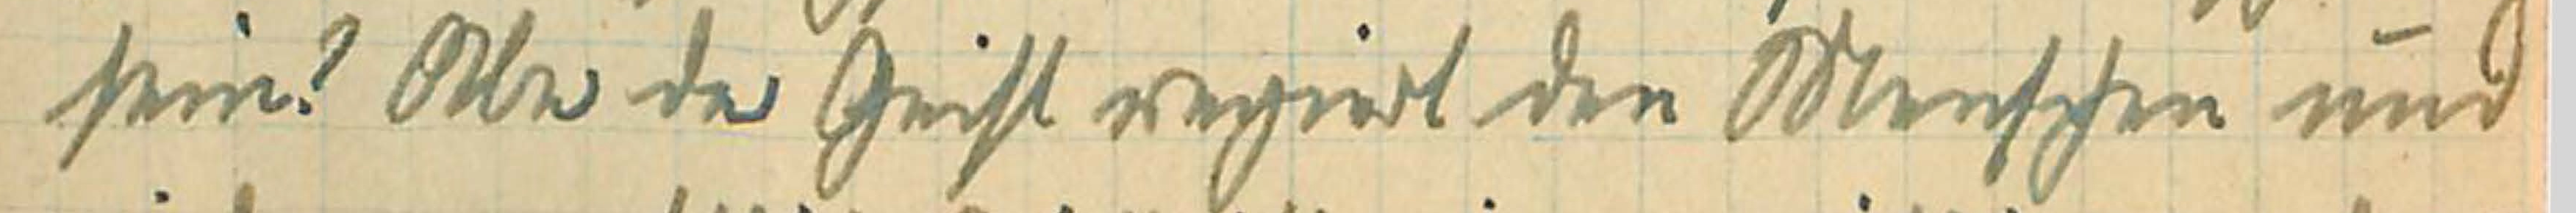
sein? Aber der Geist regiert den Menschen und
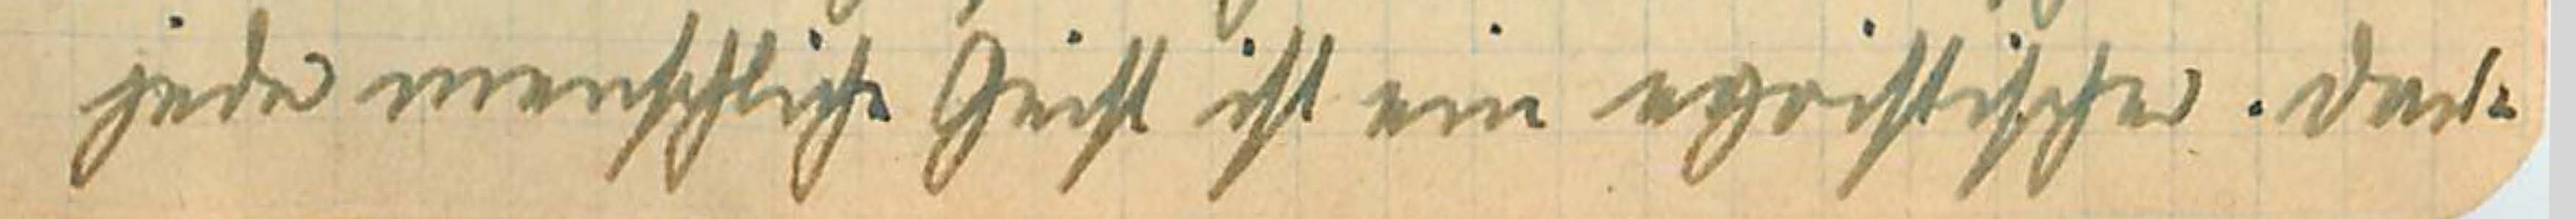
jeder menschliche Geist ist ein egoistischer. Dar-
